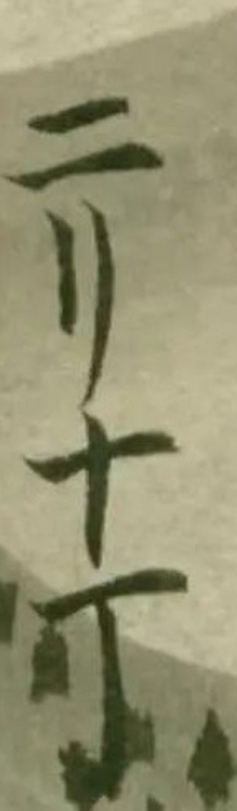二リ十丁
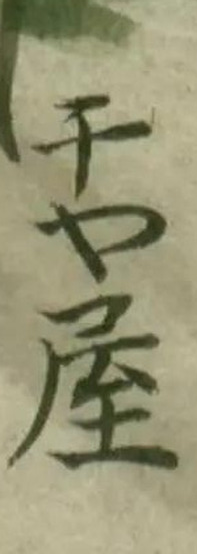チヤ屋
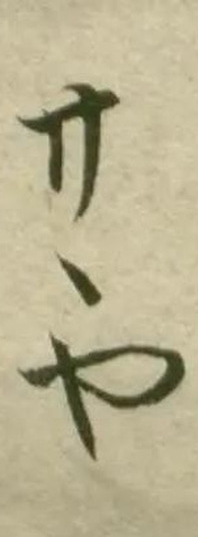サヽヤ
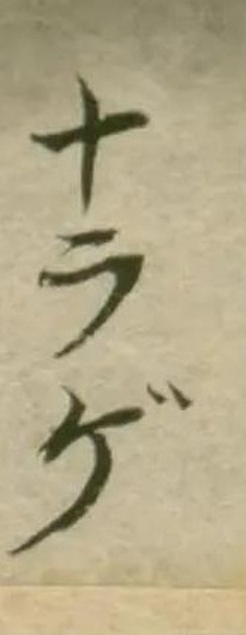ナラゲ

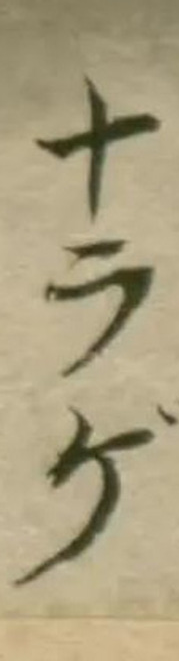ナラゲ
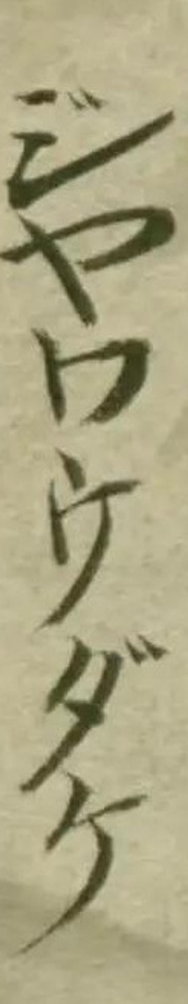ジヤワウダケ
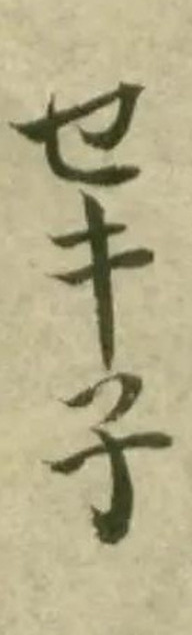セキネ
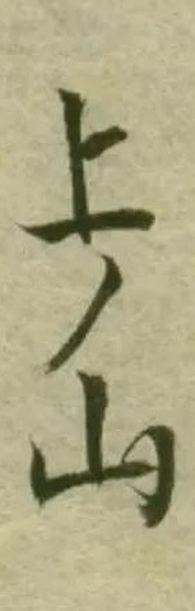上ノ山
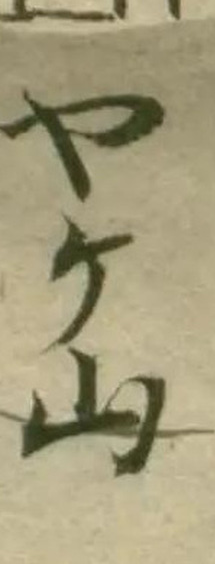ヤケ山

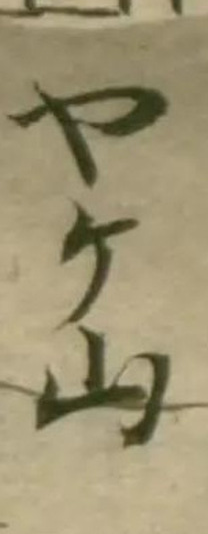ヤケ山
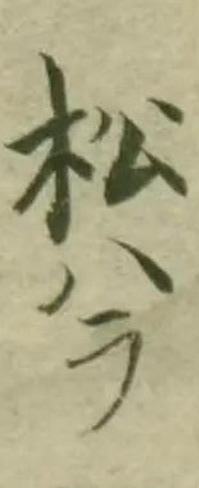松ハラ
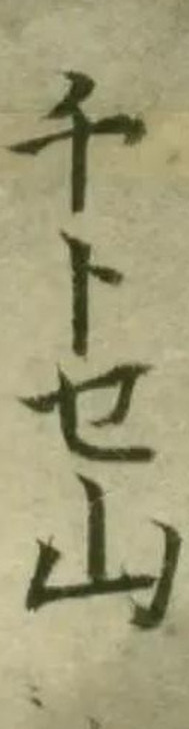チトセ山
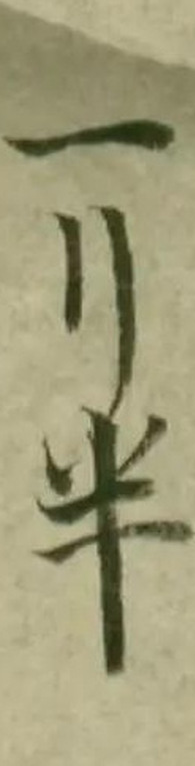一リ半
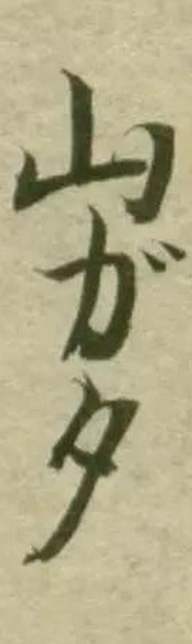山ガタ
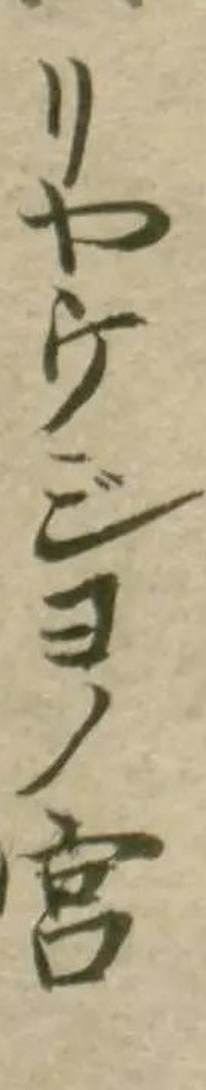リヤウジヨノ宮
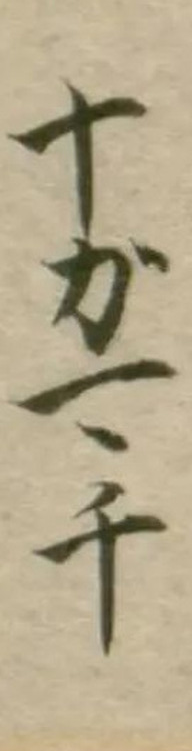ナガマチ
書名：江戸より奥州津輕迄道筋之圖
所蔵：国立国会図書館 National Diet Library, JAPAN
